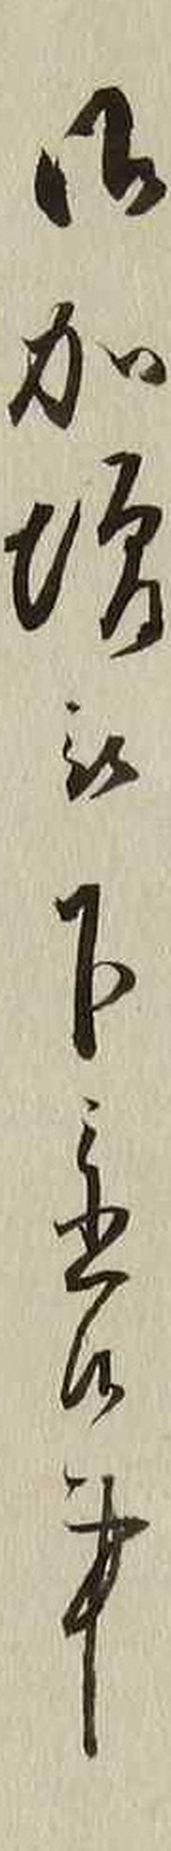御加増被下置候事
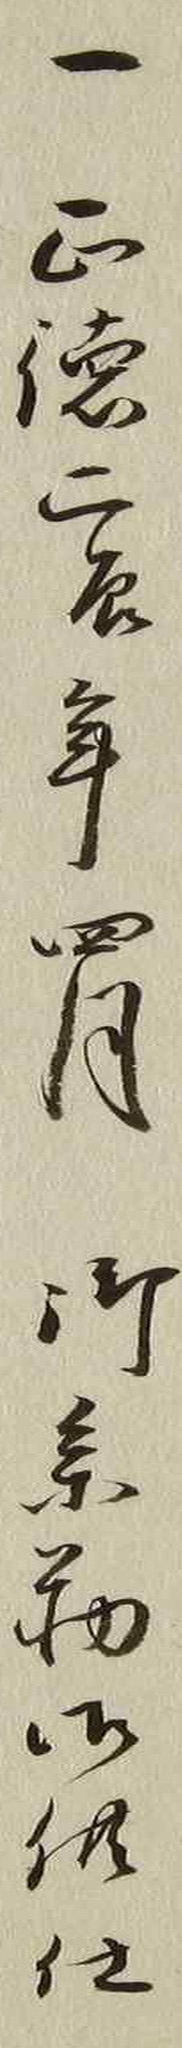一正徳二辰年四月御参勤御供仕
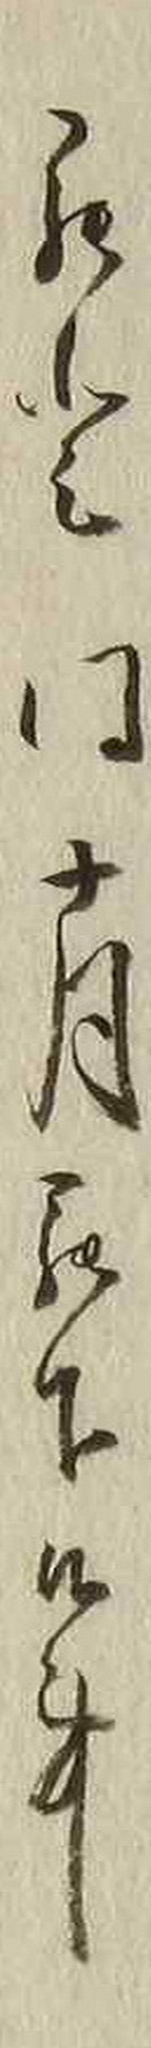罷登同十月罷下候事
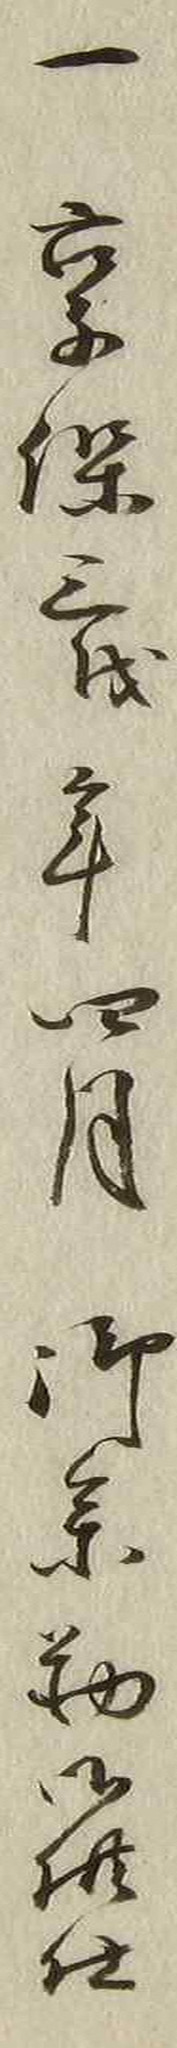一享保三戌年四月御参勤御供仕
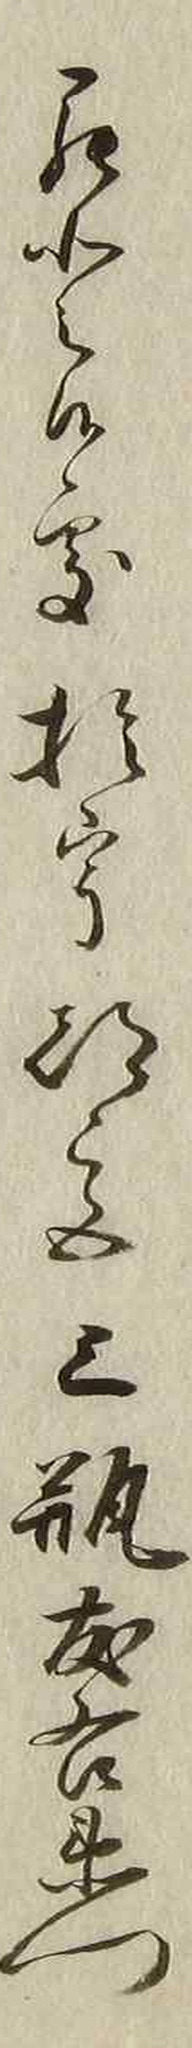罷登候処於宇都宮三瓶友右衛門
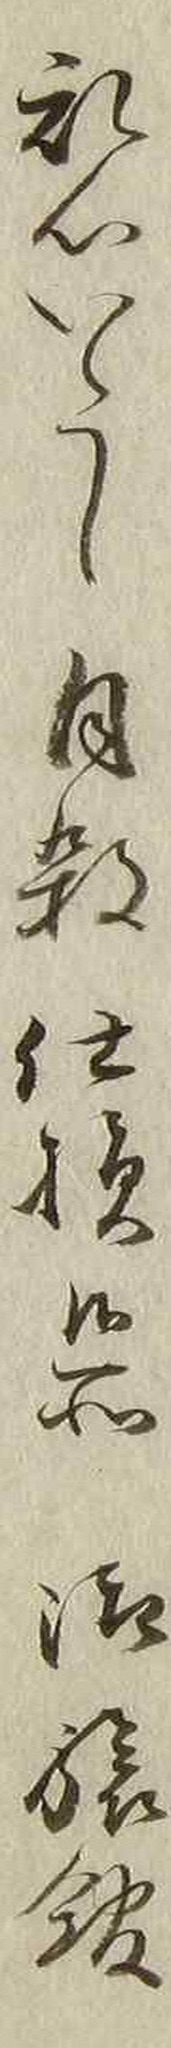乱心いたし自殺仕損候所御旅館
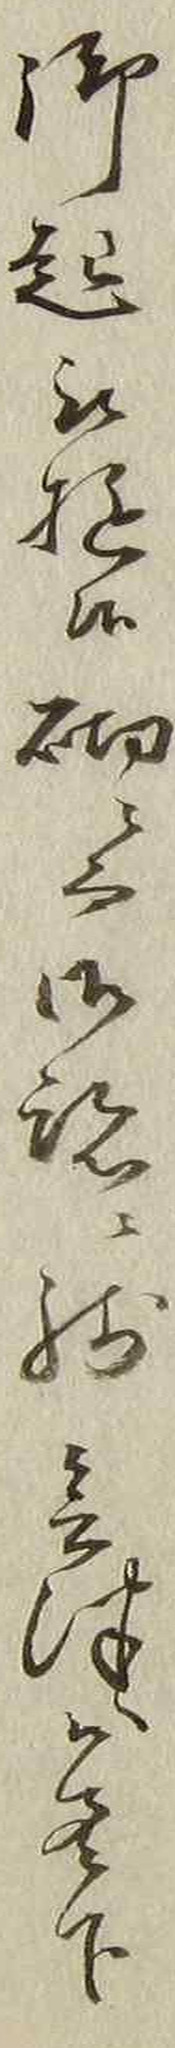御起被遊候砌ニ而御跡に残会津へ被差下
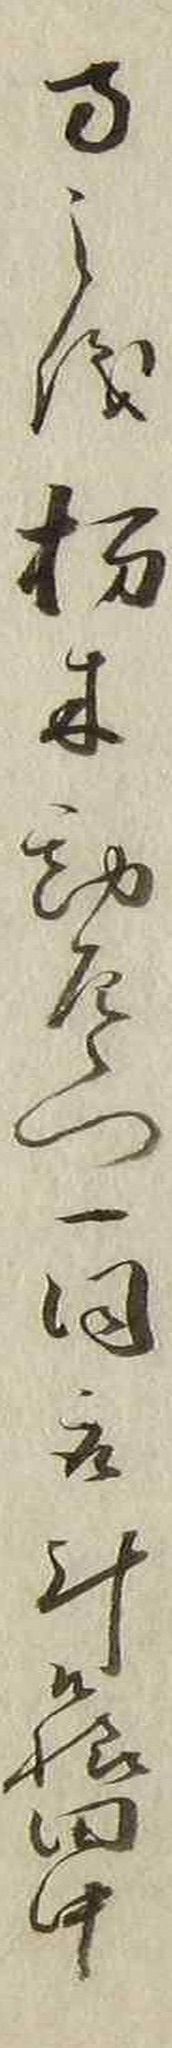方之儀栃木勘左衛門一同取計候様田中
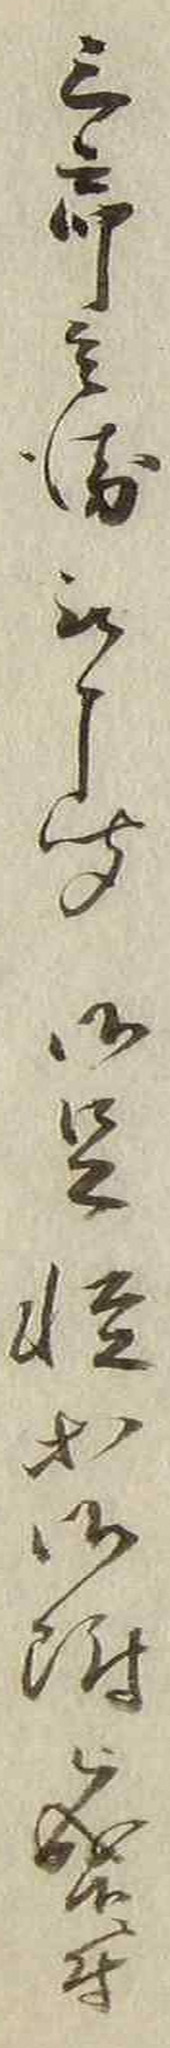三郎兵衛被申聞御足軽等御附被成候ニ付
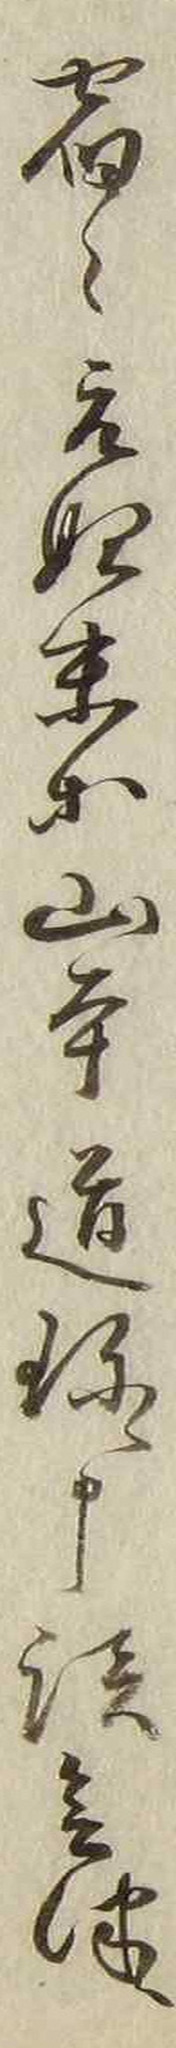宿々取始末等山本道珎へ申談会津へ

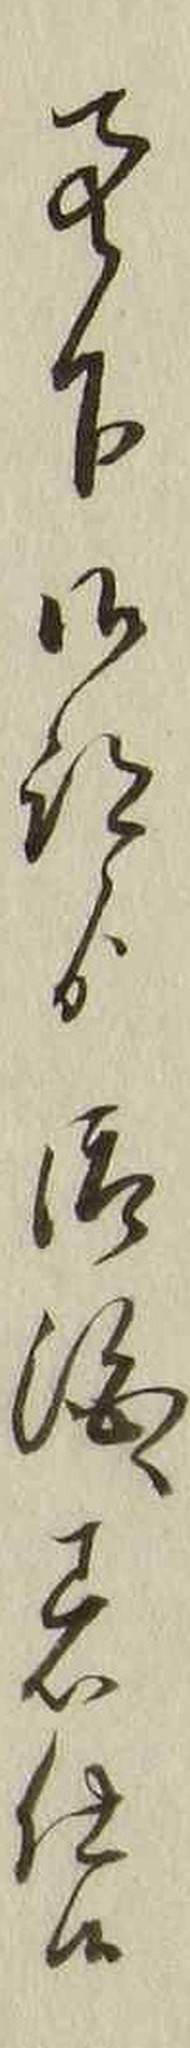差下御跡ゟ御泊へ着仕候
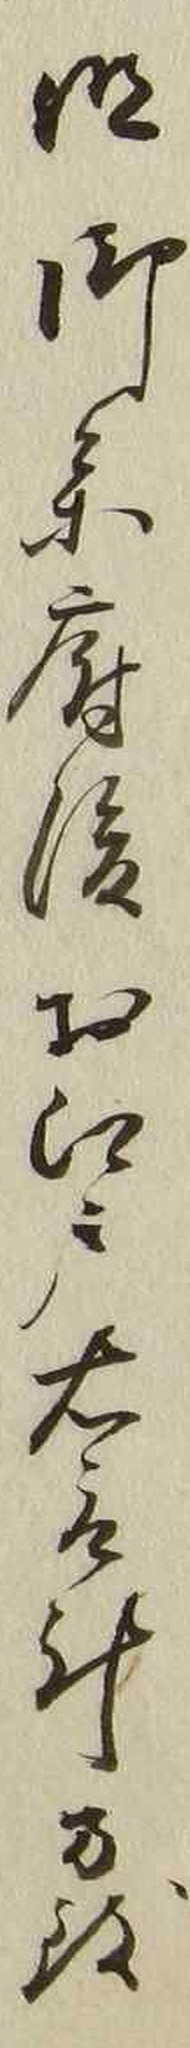但御参府後於江戸右取計方致
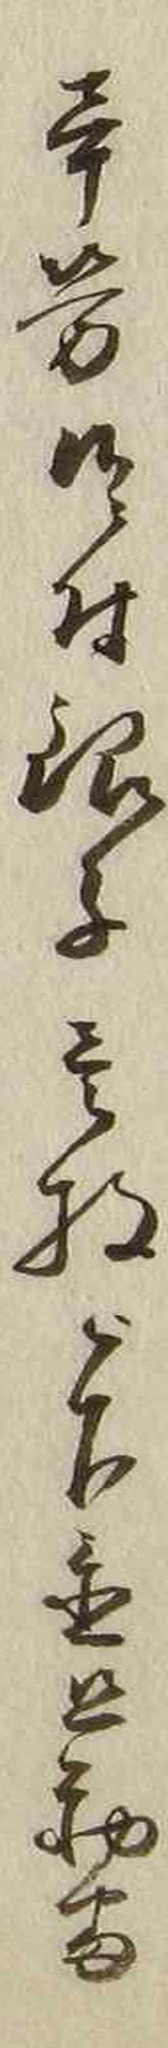辛労候ニ付銀子壱枚被下置且勤番
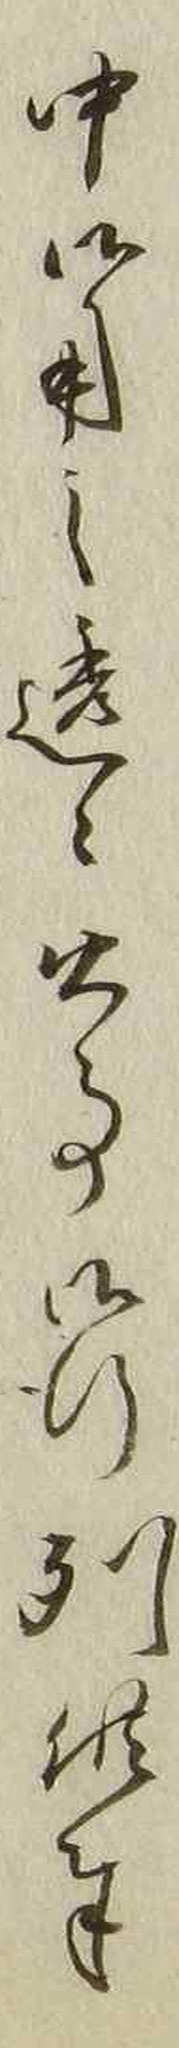中御用之透ニ火事御行列供奉
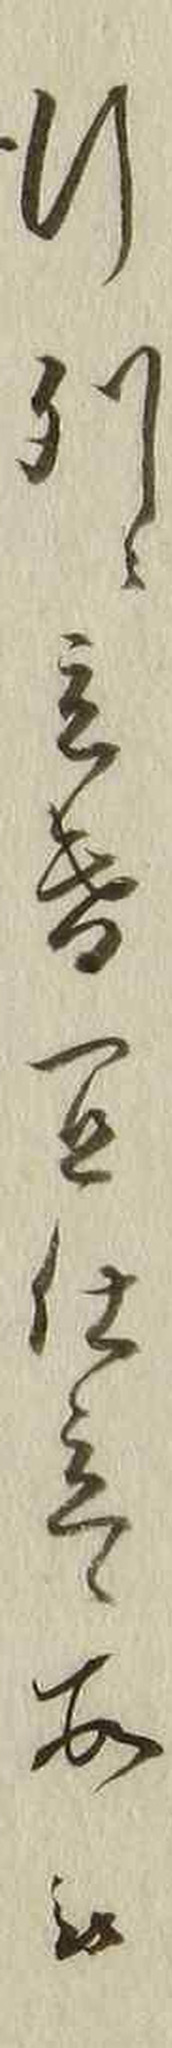行列ニ立替宜仕立候段被
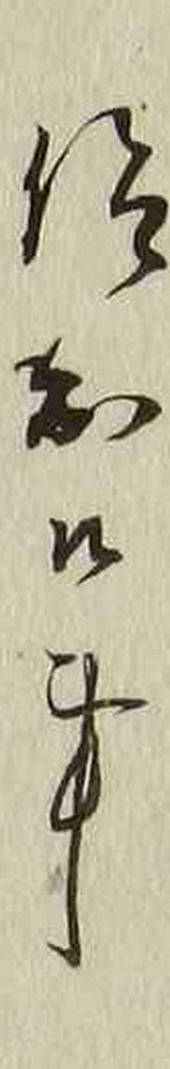仰出候事
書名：諸士系譜　巻之28　い之部28
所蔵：会津若松市立会津図書館
